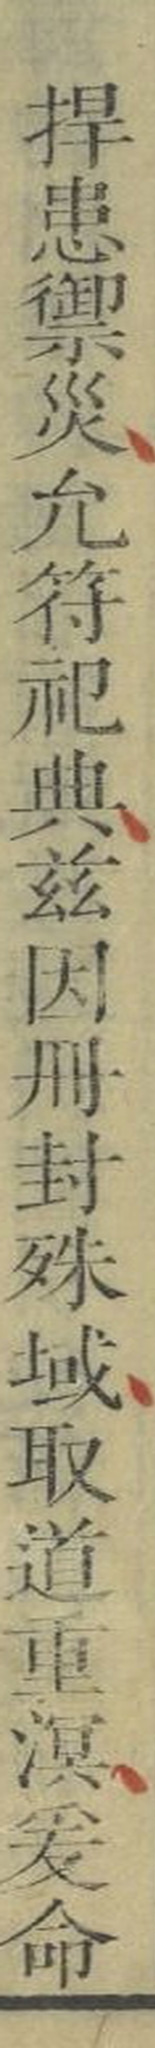捍患禦災允符祀典茲因冊封殊域取道重溟爰命
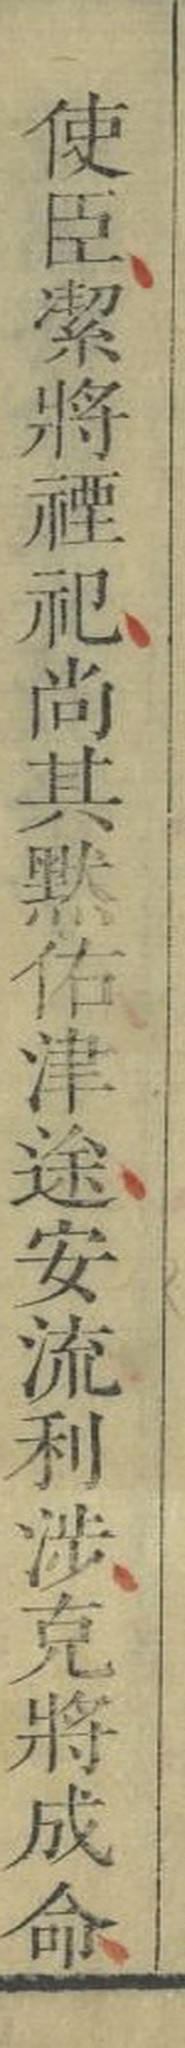使臣㓗將禋祀尚其默佑津途安流利涉克將成命
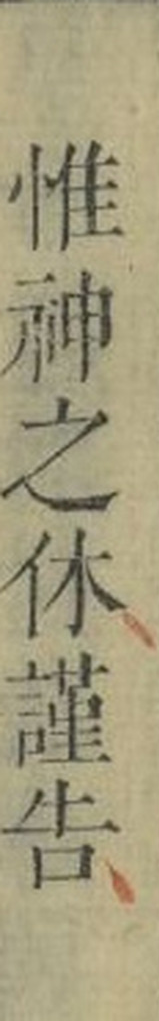惟神之休謹告
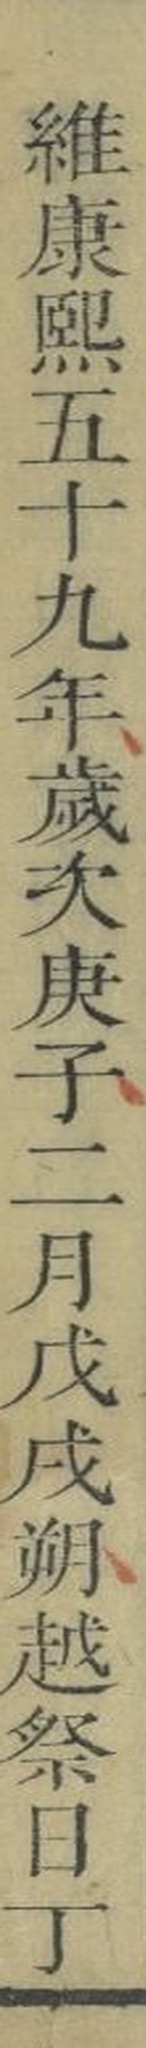維康熙五十九年歲次庚子二月戊戌朔越祭日丁

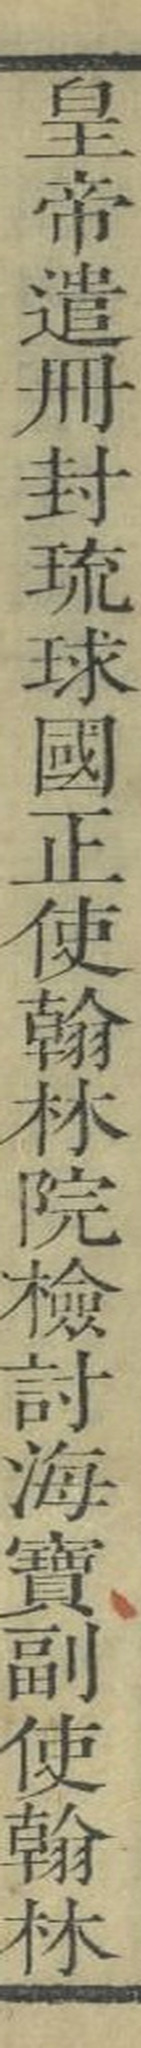皇帝遣冊封琉球國正使翰林院檢討海寶副使翰林
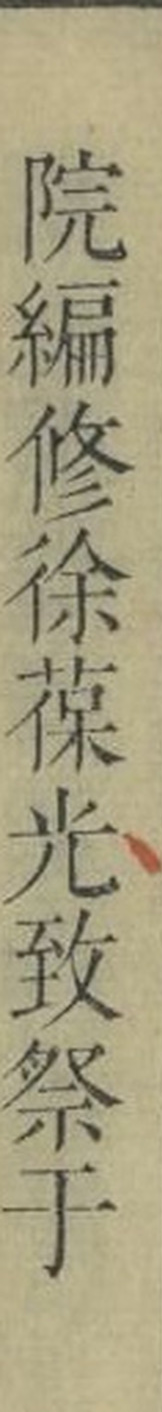院編修徐葆光致祭于
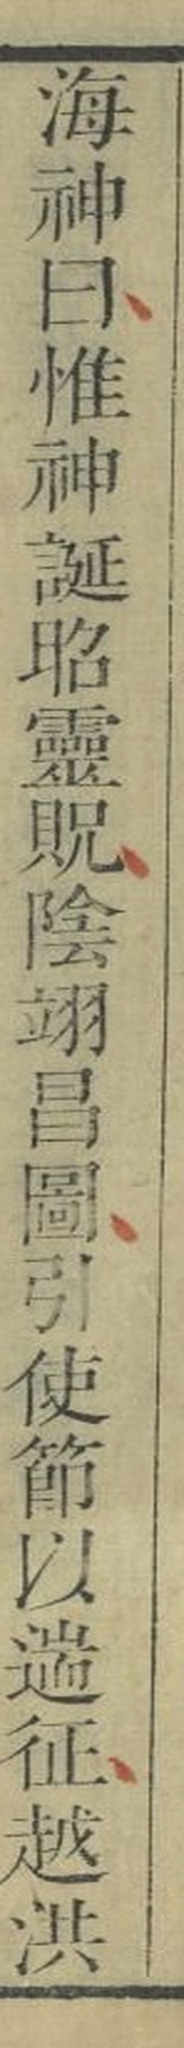海神曰惟神誕昭靈貺陰翊昌圖引使節以遄征越洪
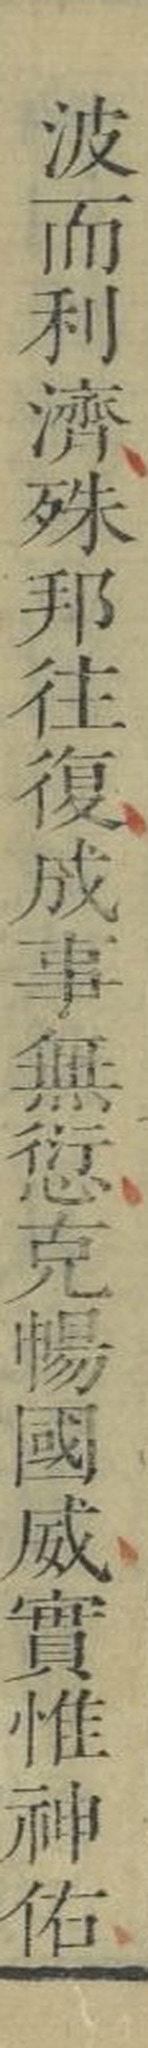波而利濟殊邦往復成事無愆克暢國威實惟神佑
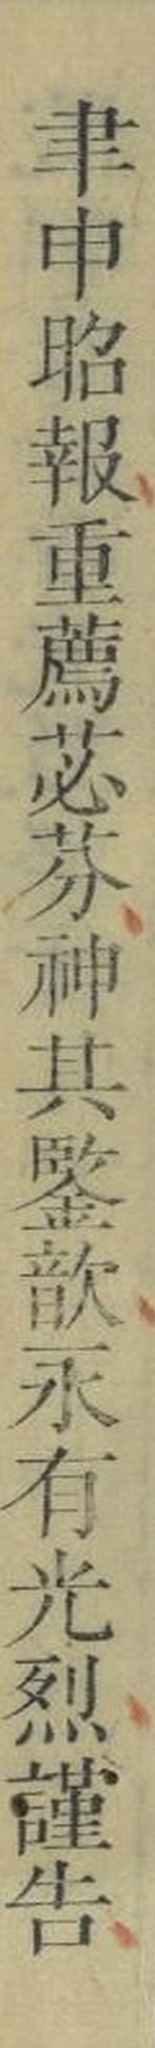聿申昭報重薦苾芬神其鍳歆永有光烈謹告
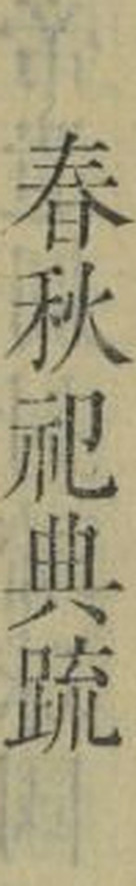春秋祀典䟽
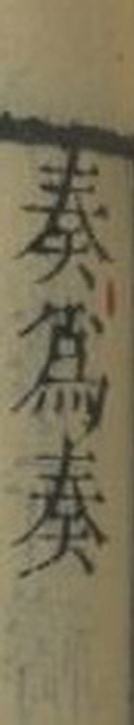奏爲奏
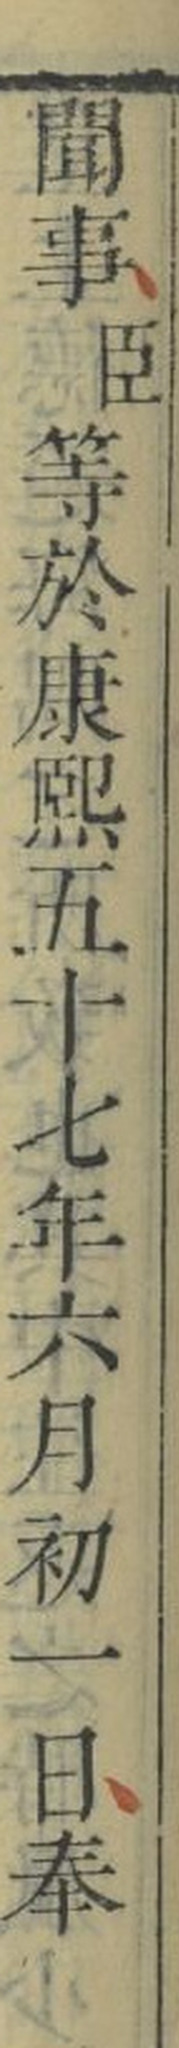聞事臣等於康熙五十七年六月初一日奉
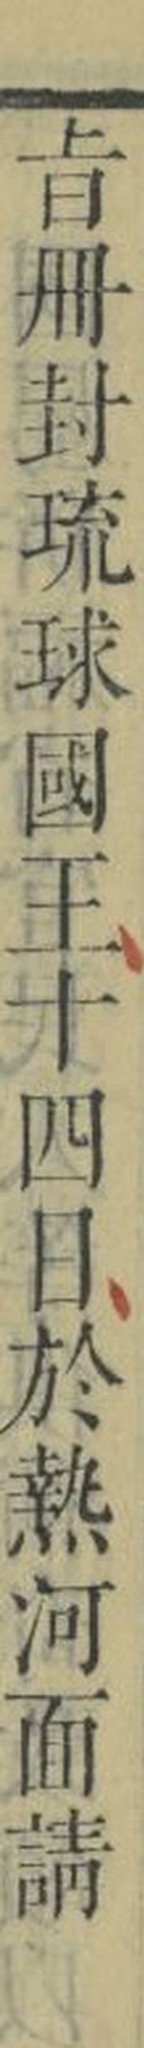㫖冊封琉球國王十四日於𤍠河面請
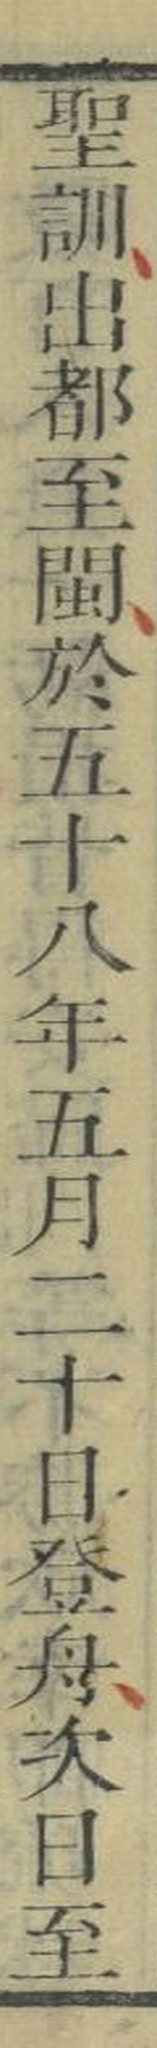聖訓出都至閩於五十八年五月二十日登舟次日至
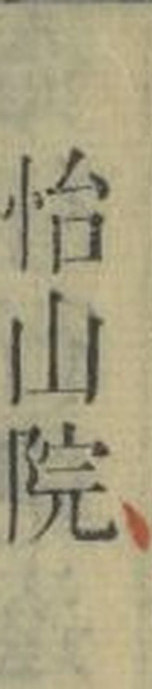怡山院
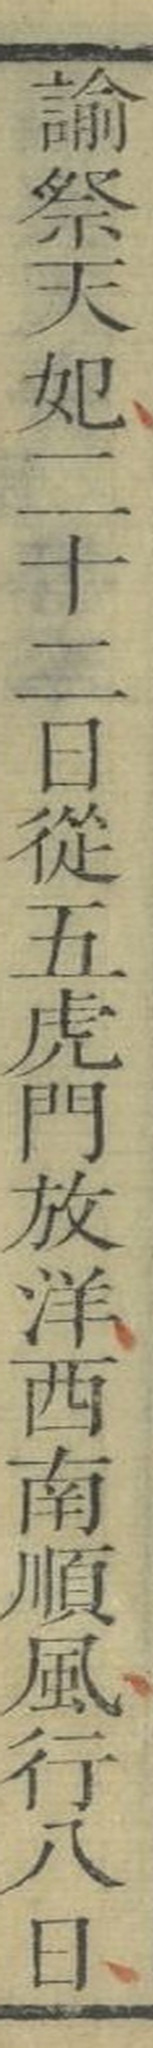諭祭天妃二十二日從五虎門放洋西南順風行八日
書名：中山伝信録 巻一、巻二
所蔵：University of the Ryukyus Library
